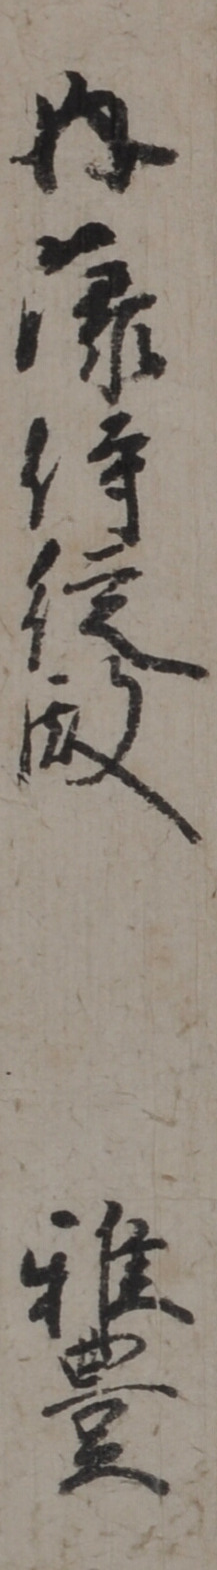内藤侍従殿雅豊

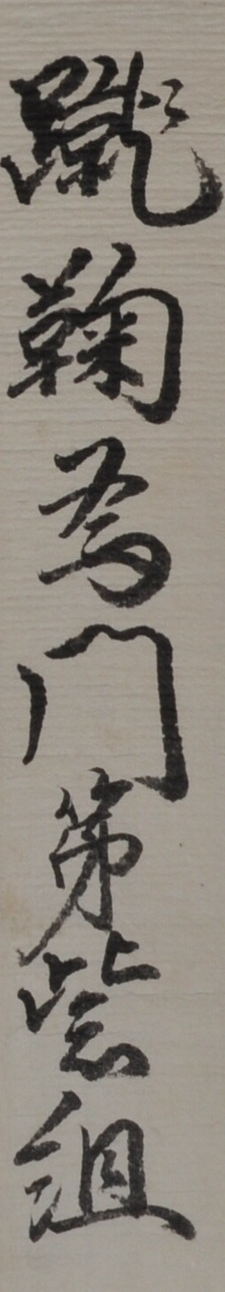蹴鞠為門弟紫組
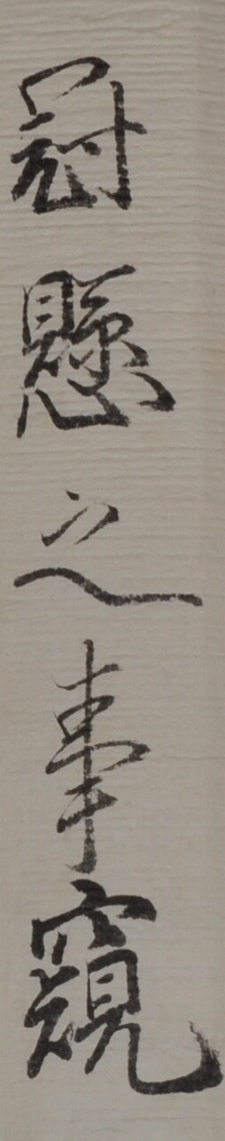冠懸之事窺
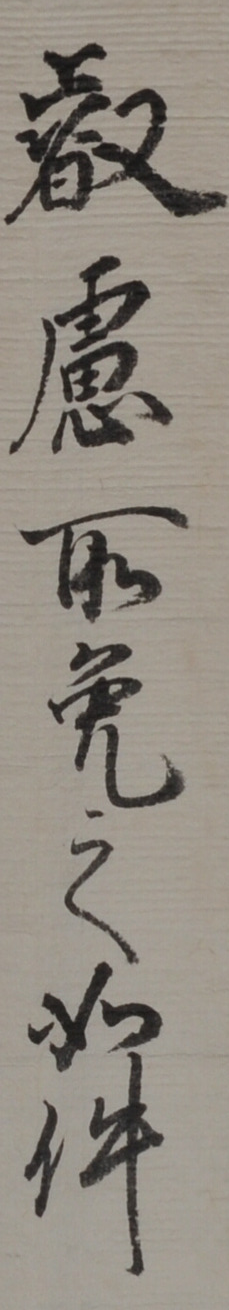叡慮所免之如件
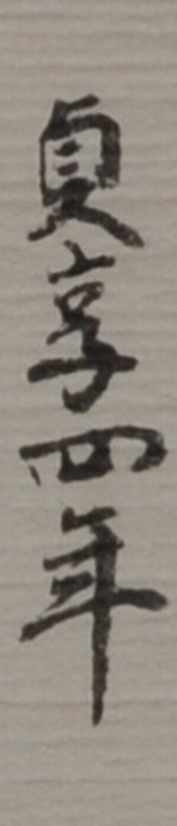貞享四年
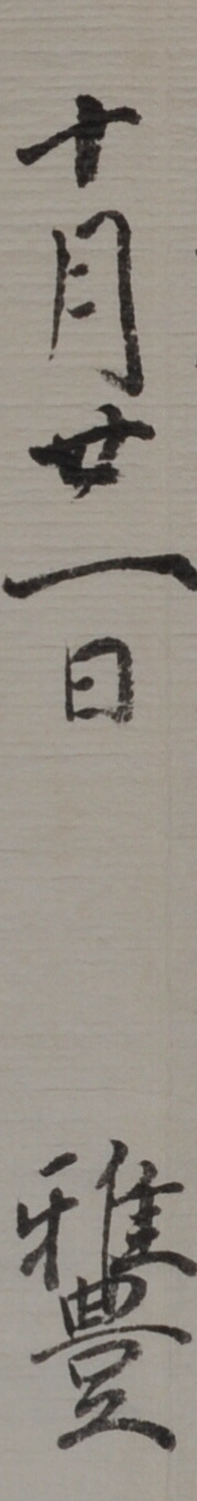十月廿一日雅豊
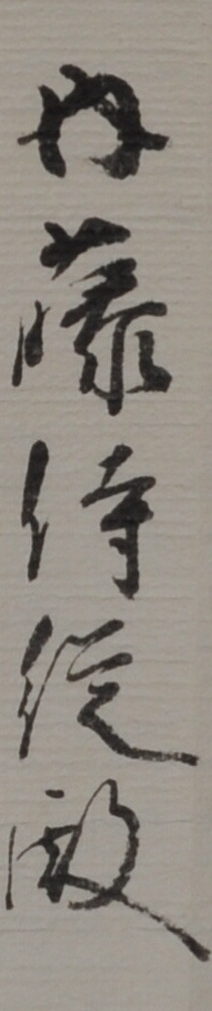内藤侍従殿
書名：蹴鞠免許状
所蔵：伊那市立高遠町図書館・合同会社AMANE
